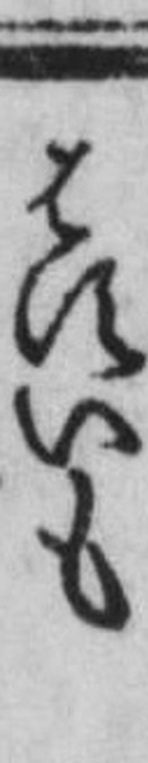はすいも
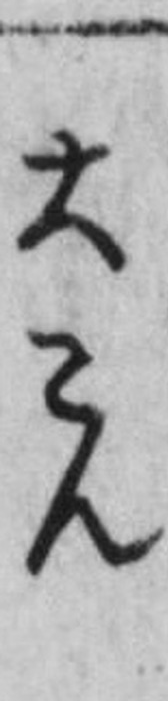大こん
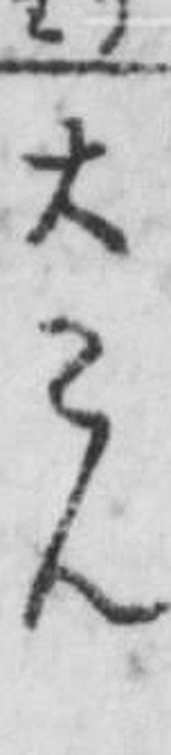大こん
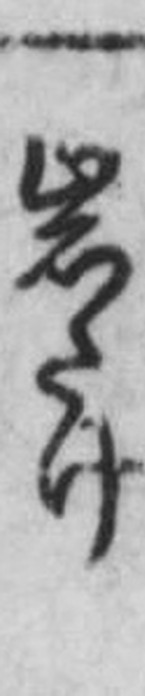岩たけ
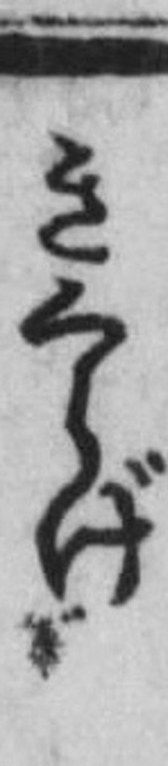きくらげ
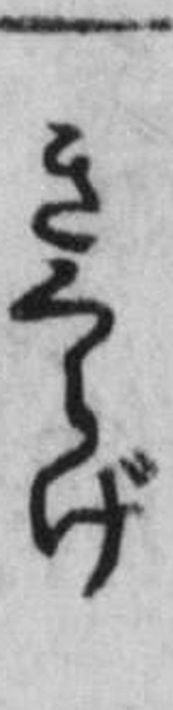きくらげ
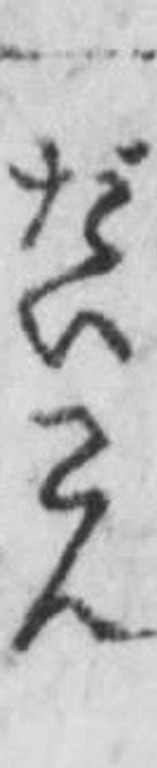だいこん
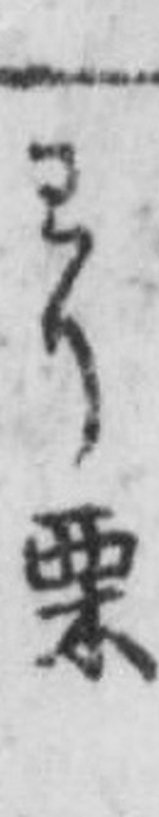わり栗
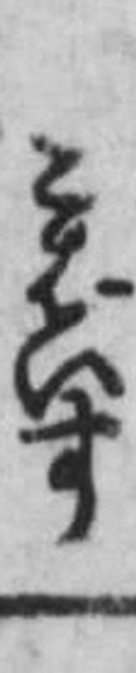こばいす
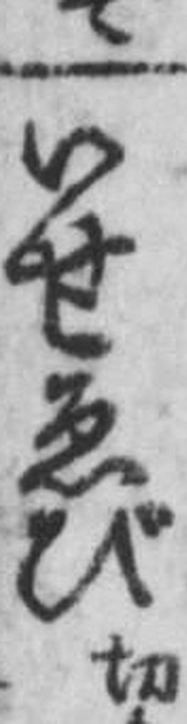よせゑび
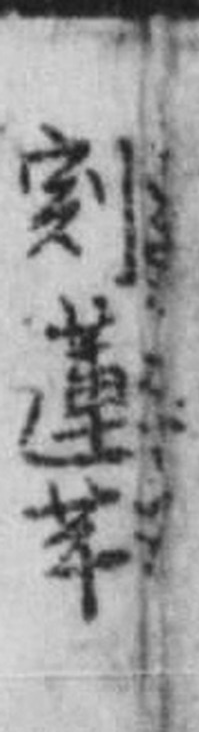刻蓮芋
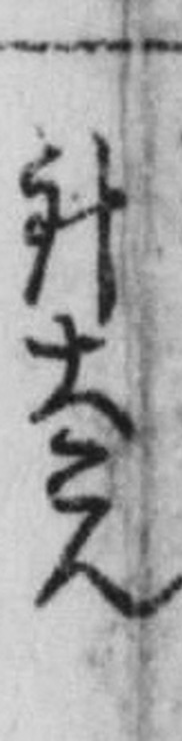針大こん
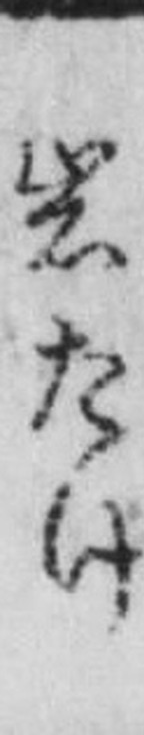岩たけ
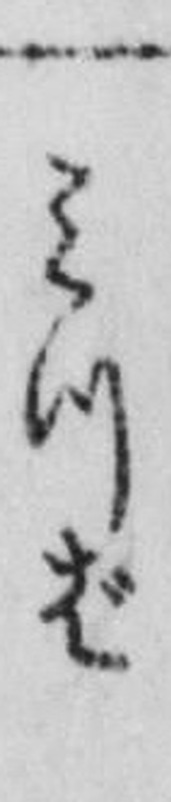みつば
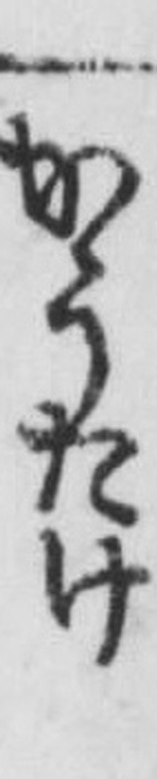かうたけ
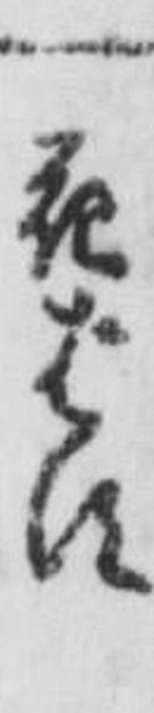花ばす
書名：精進魚類間合料理/早速庖丁
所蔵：大阪府立大学学術情報センター 国文学研究資料館
